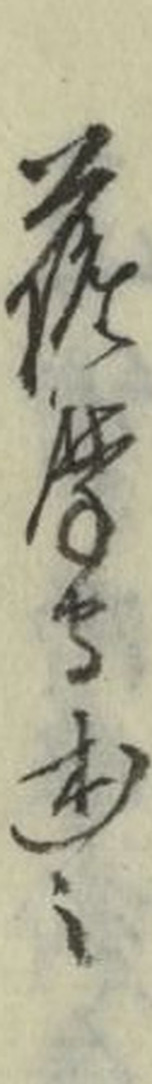薩摩守述之
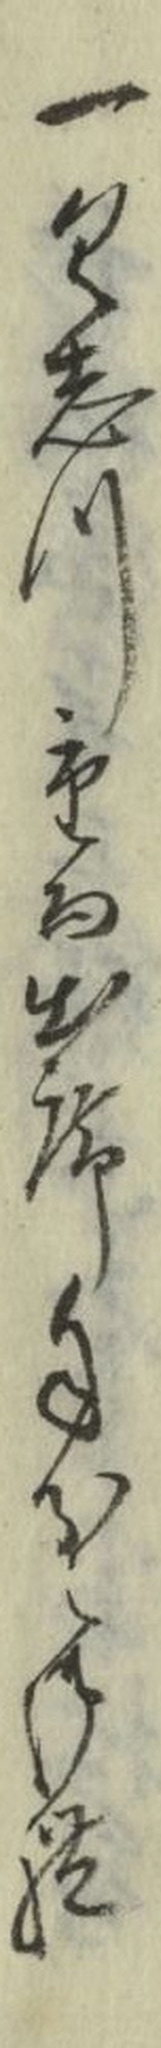一具志川重而出席自分之御礼

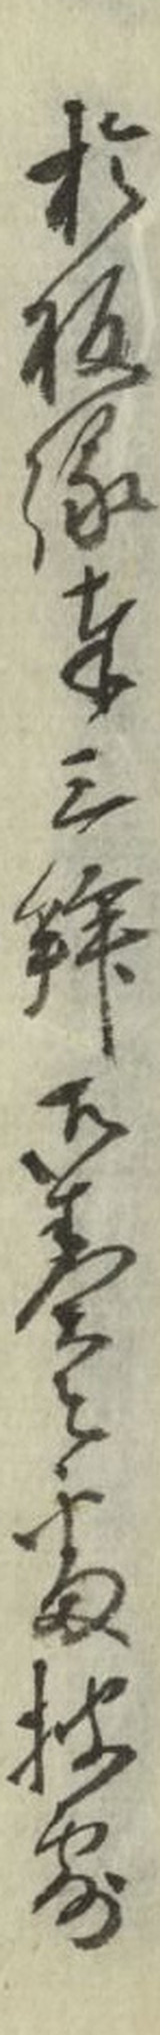於板縁奉三拝御奏者番披露
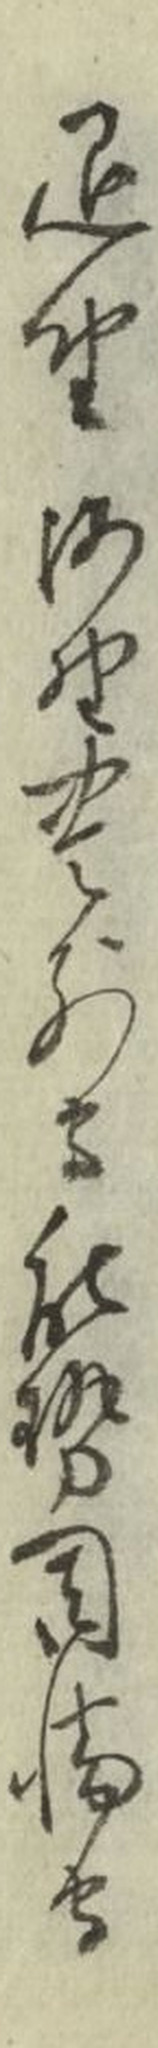退坐河野豊前守能勢因幡守
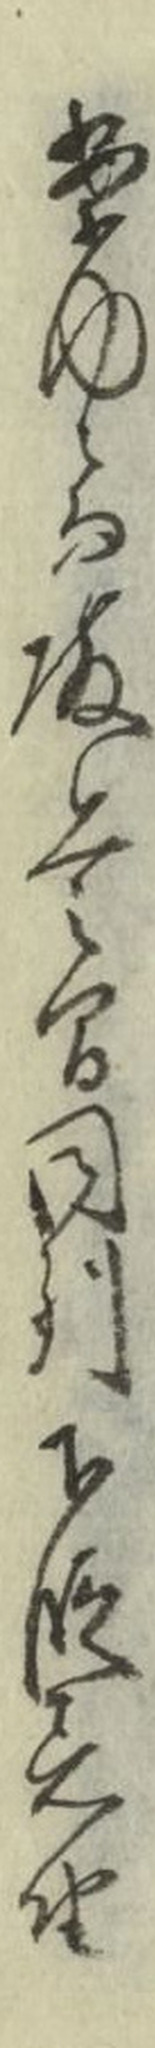案内に而殿上之間同列下段着坐
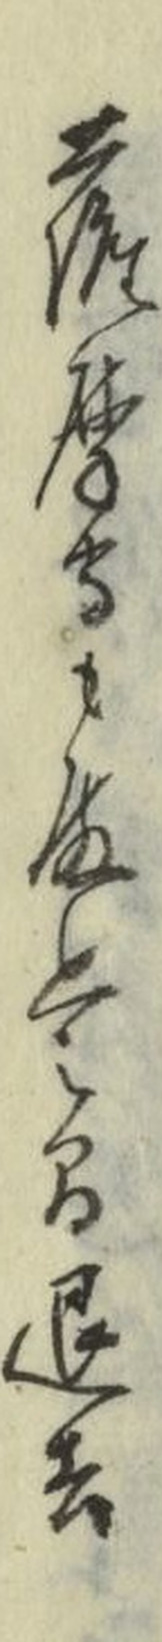薩摩守も殿上之間退去
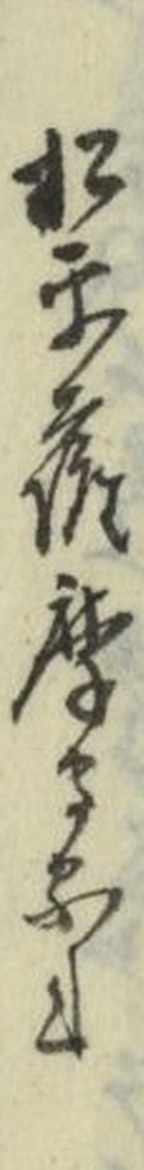松平薩摩守家来
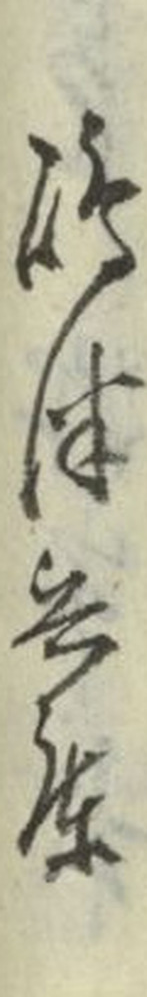島津兵庫
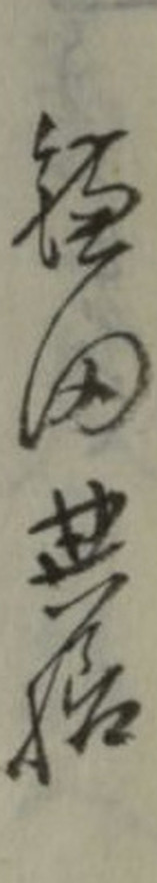鎌田典膳
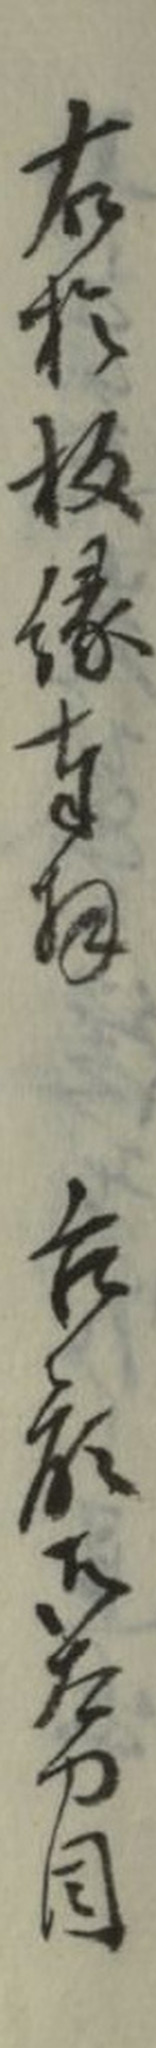右於板縁奉拝台顔御太刀目
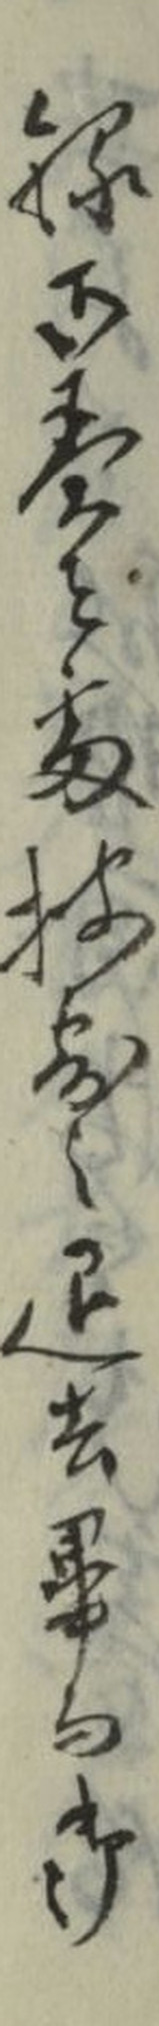録御奏者番披露之退去畢而御
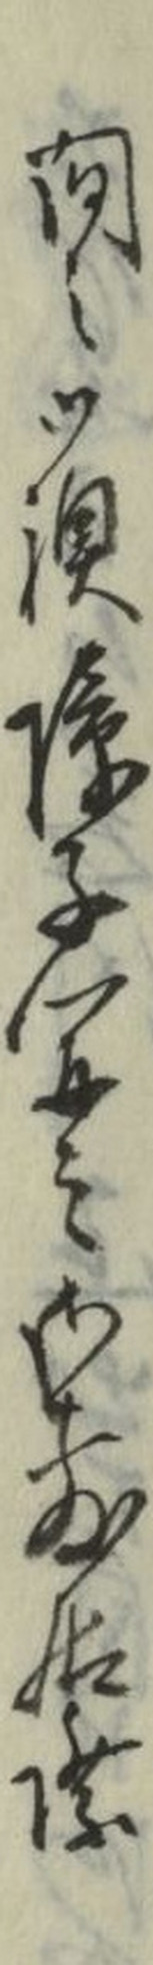間之御襖障子開之御敷居際
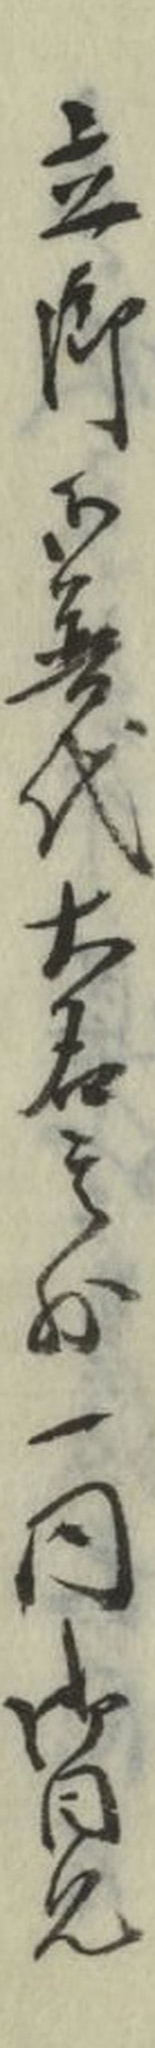立御御普代大名其外一同御目見
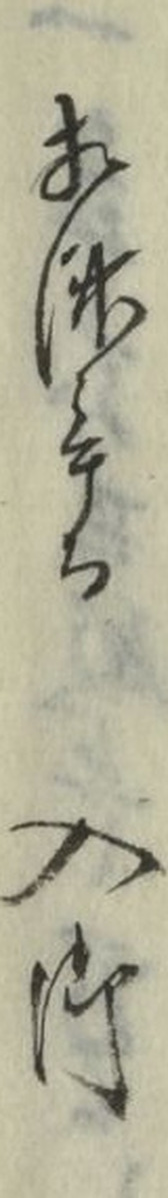相済畢而入御

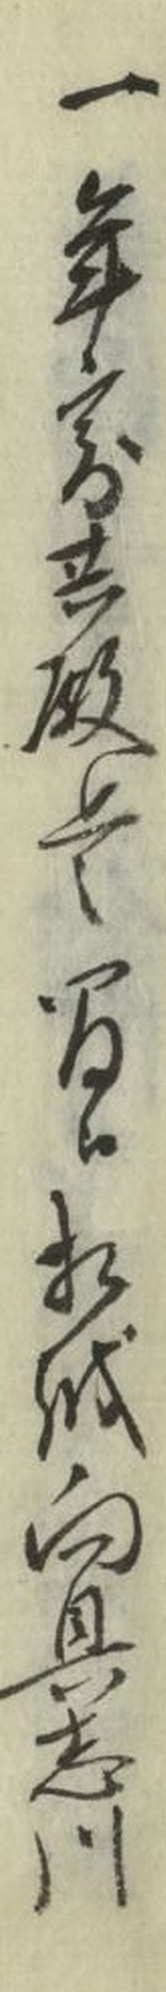一年寄共殿上之間え相越向具志川
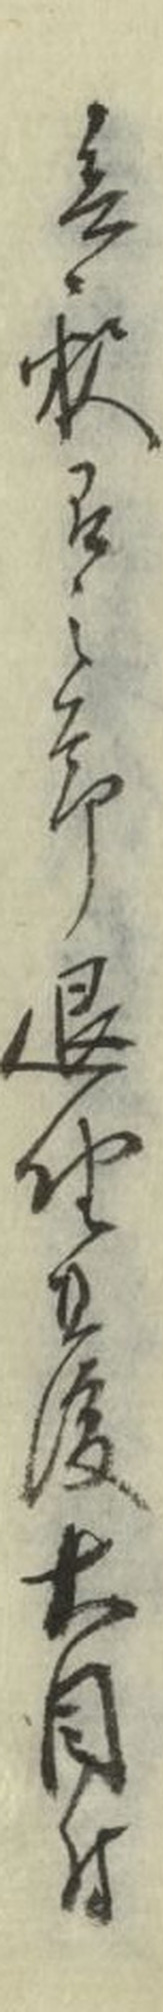会釈有之節退坐其後大目付
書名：琉球人来朝記 一之二
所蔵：University of the Ryukyus Library
